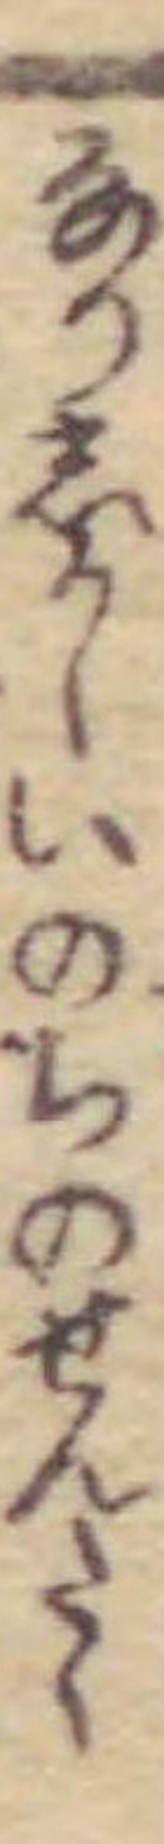なりしかしいのちのせんたく
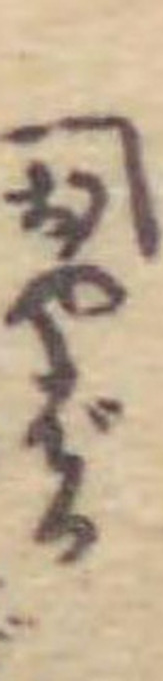〽おやばか
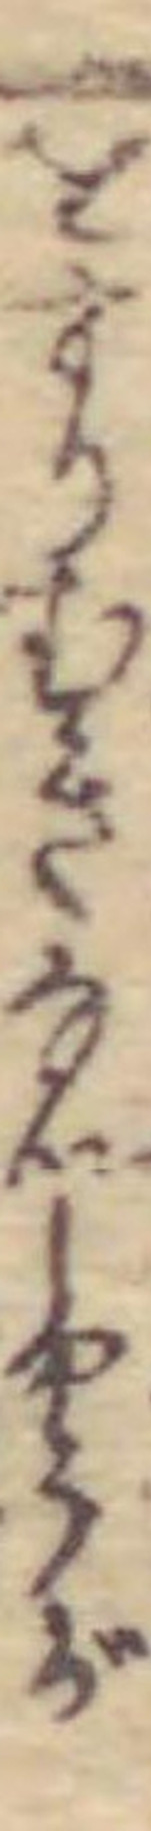をすりむきないしやうが
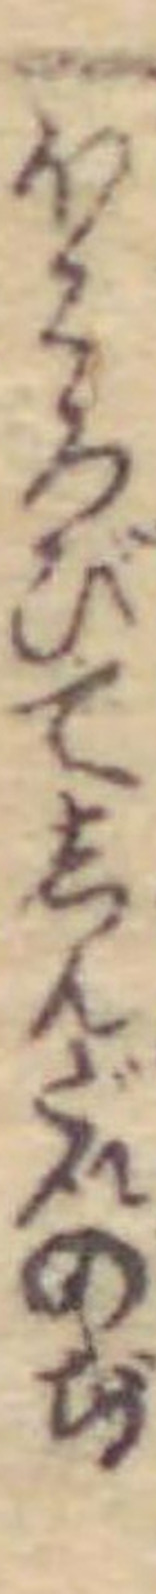ほころびてしんだいのぢ
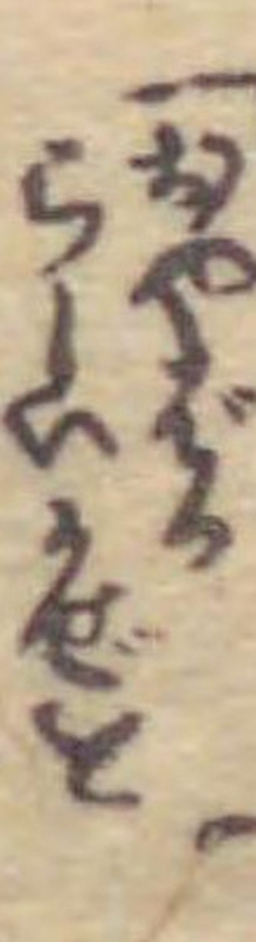らしいかぜを
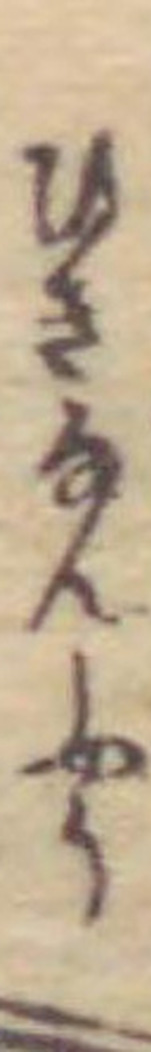ひきなんしやう
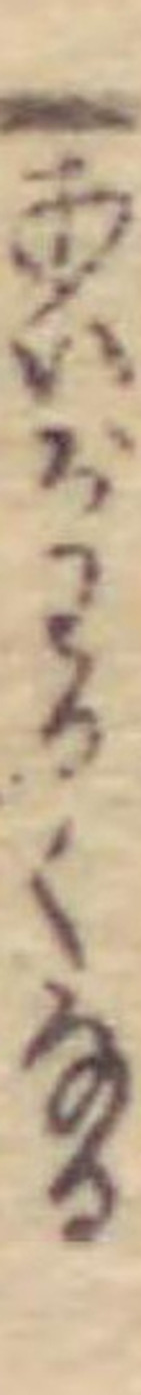あいがわるくなる
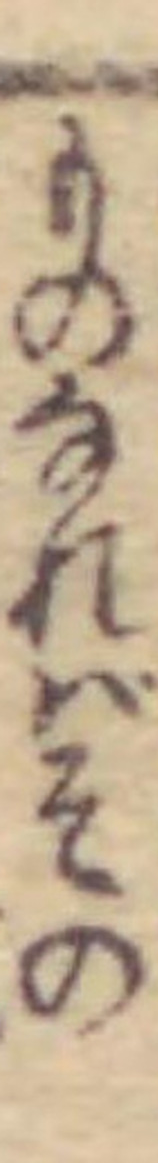ものなればその
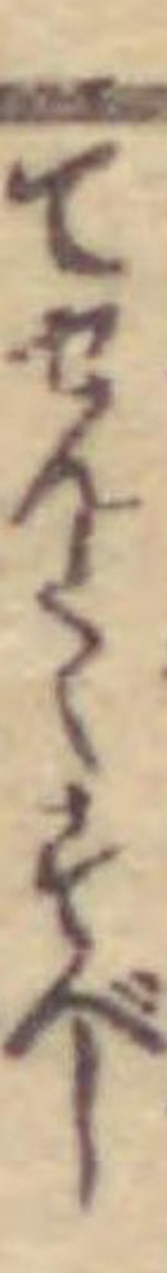てせんたくすべし
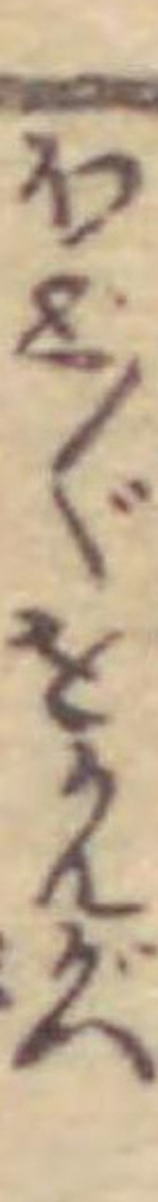ほど〴〵をかんがへ
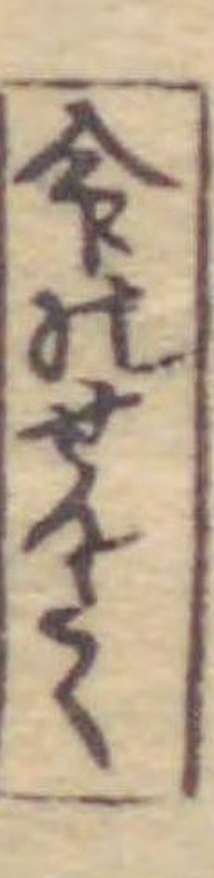に命のせんたく
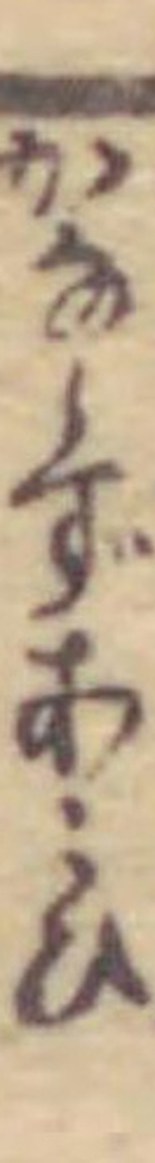かならずあらひ
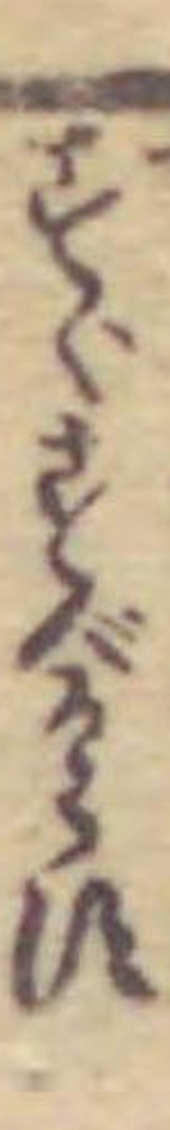すぐすべからす
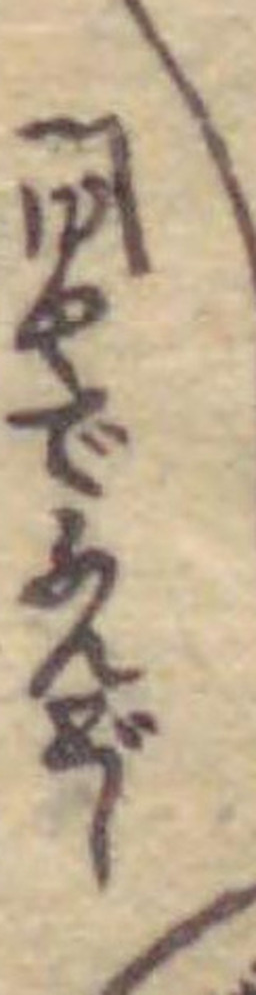〽ゆやでふんどし
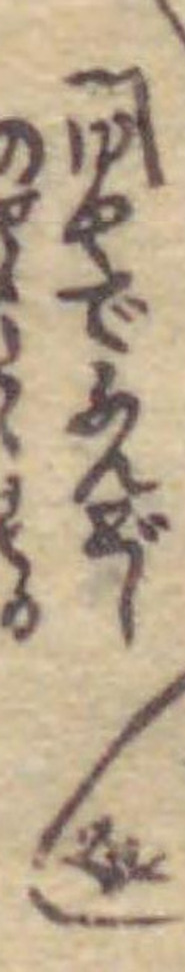〽ゆやでふんどし
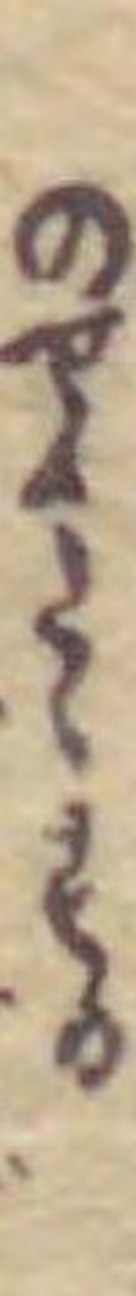のせんたくする
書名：御誂染長寿小紋 : 3巻
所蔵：国立国会図書館 National Diet Library, JAPAN
